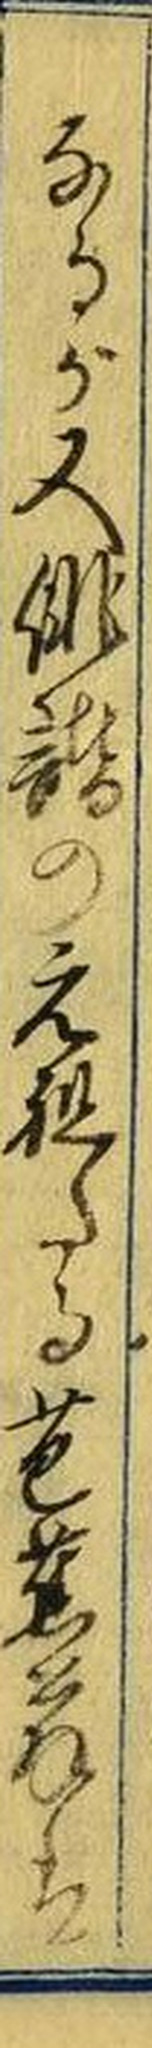なるが又俳諧の元祖たる芭蕉翁は
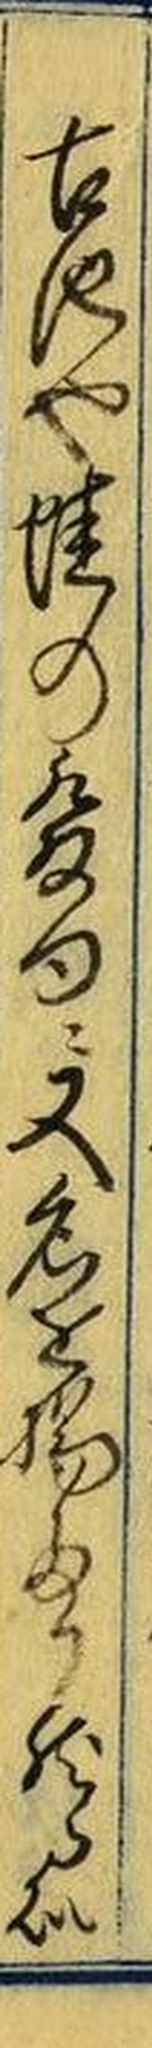古池や蛙の発句に又名を揚たり然る処
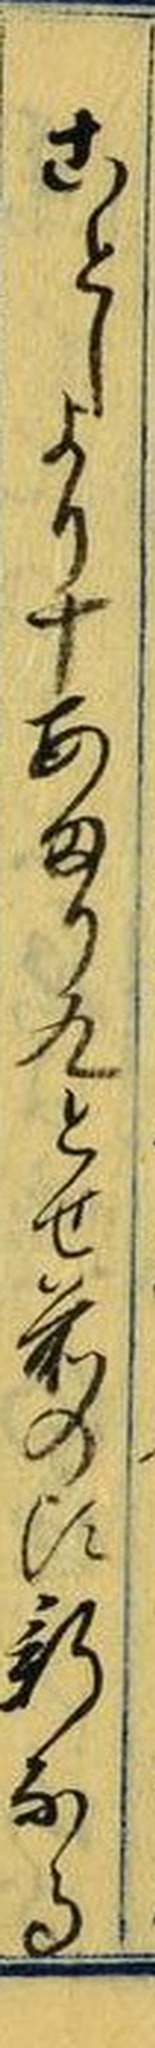ことしより十あまり九とせ前の頃新なる
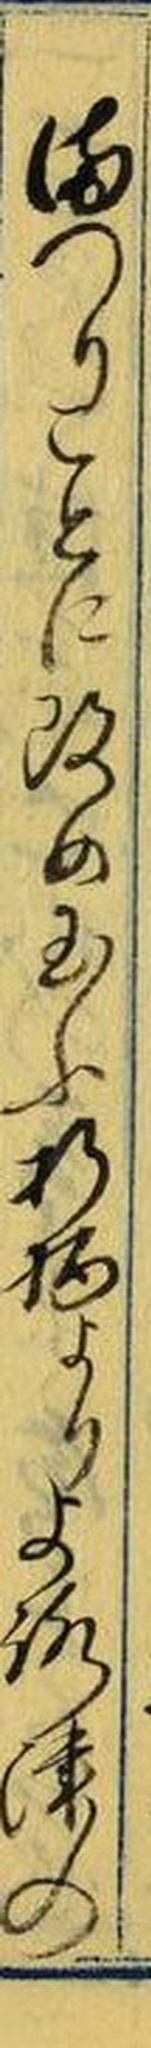まつりことに改め玉ふ折柄よりよろつの
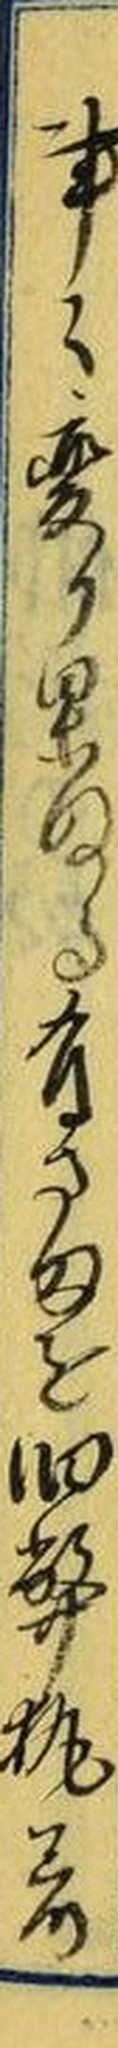事々変り果ぬる有さまを旧弊執着
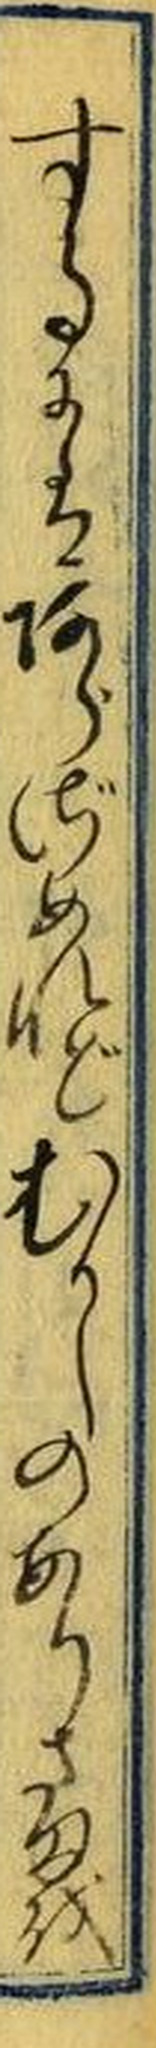するにはあらざめれどむかしのありさまを
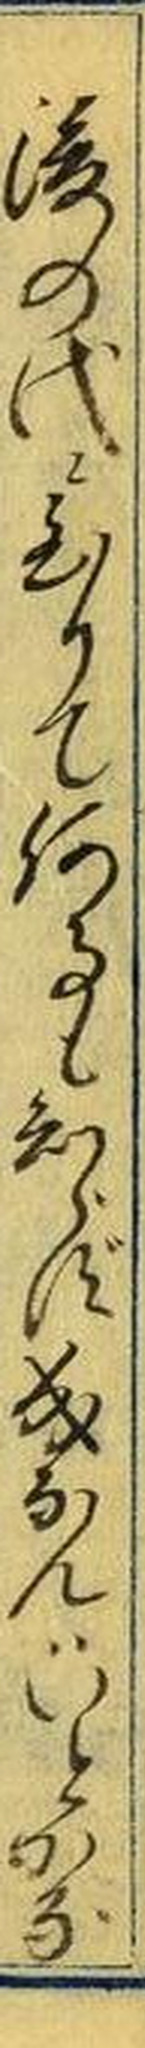後の代に至りて何事も知らず成なんはいとかな
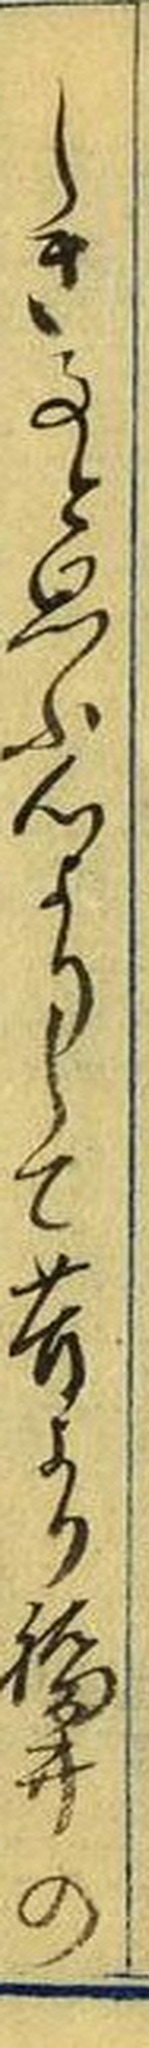しき事と思ふ心よりして昔より福井の
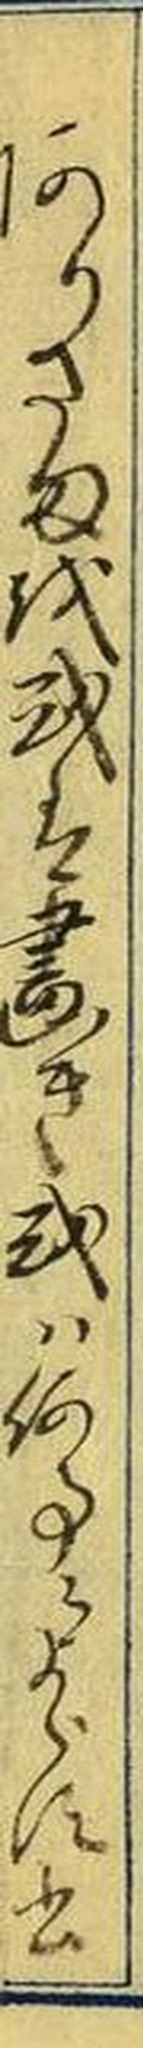ありさまを或は画き或は何事によらす書
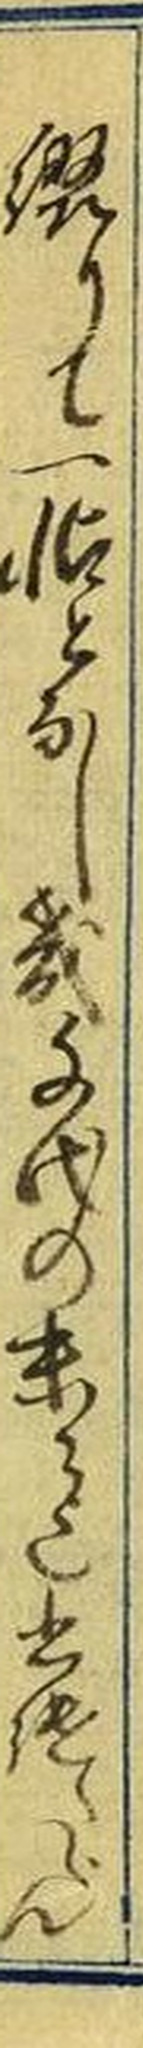綴りて一帖となし幾千代の末々迄書継たらん
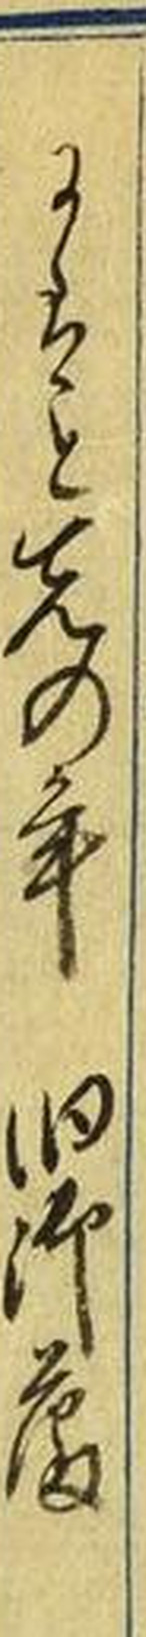にはと先の年旧御藩
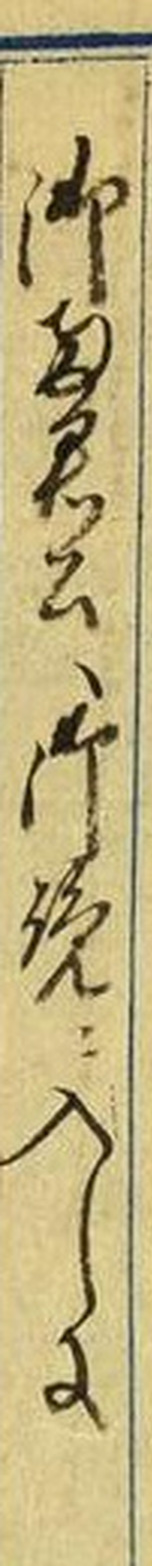御両君公へ御覧に入しに
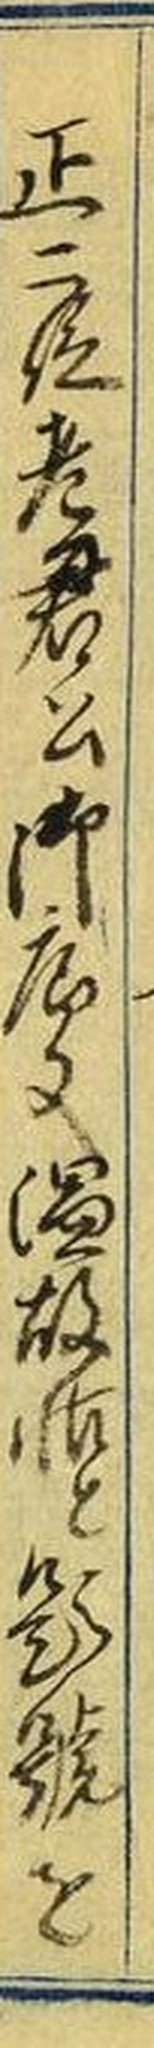正二位老君公御序文温故帖と題号を
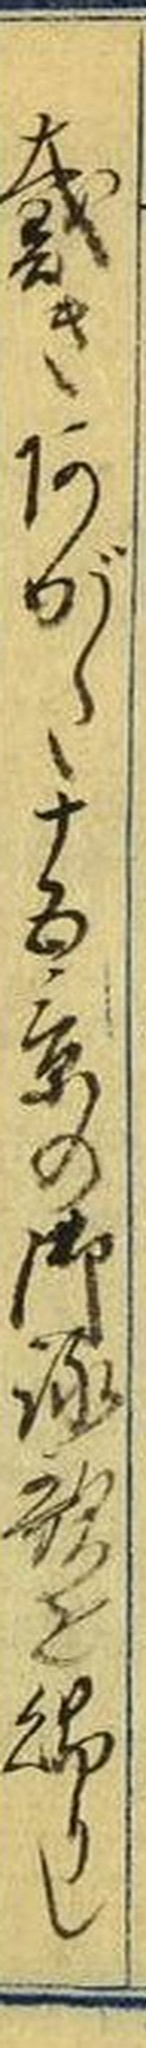戴きあがた十五景の御詠歌を賜りし
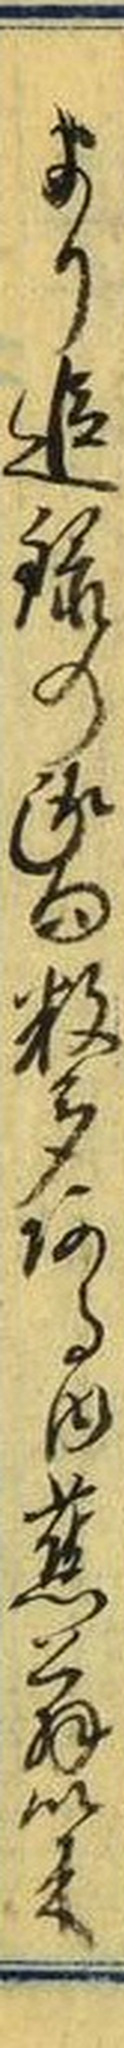より追録の趣向数多ある内芭蕉翁以来

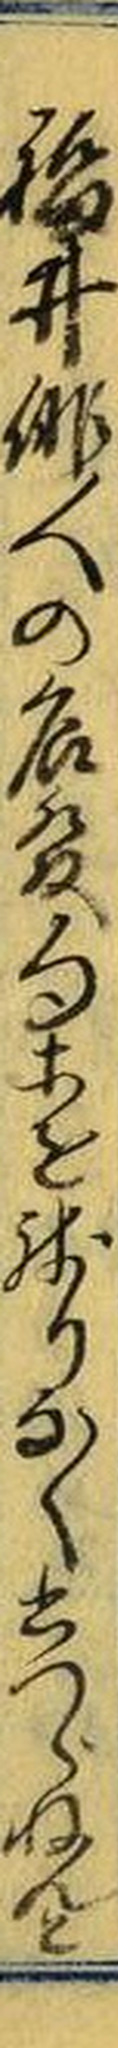福井俳人の名発句等を残りなく書つらねんと
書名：温古集 三巻
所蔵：福井県文書館 Fukui Prefectural Archives
